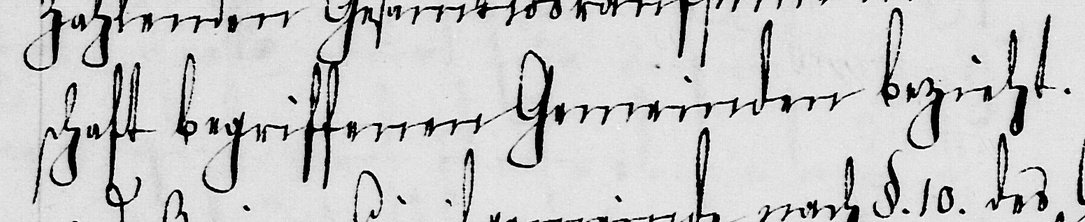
schaft begriffenen Gemeinden bezieht.
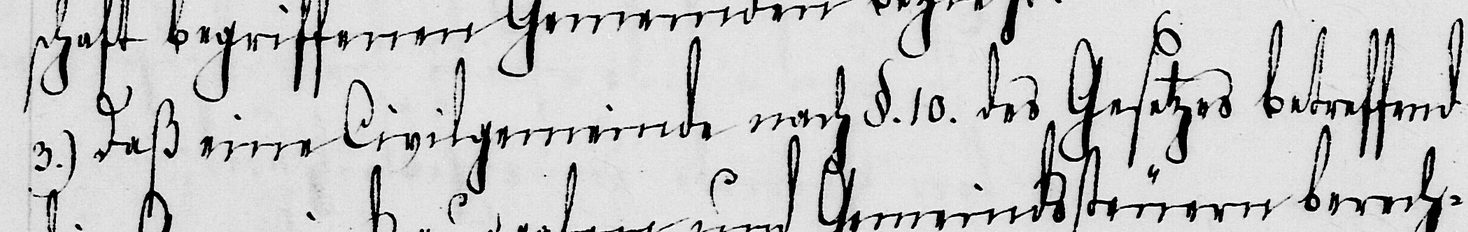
3.) Daß eine Civilgemeinde nach §. 10. des Gesetzes betreffe¬
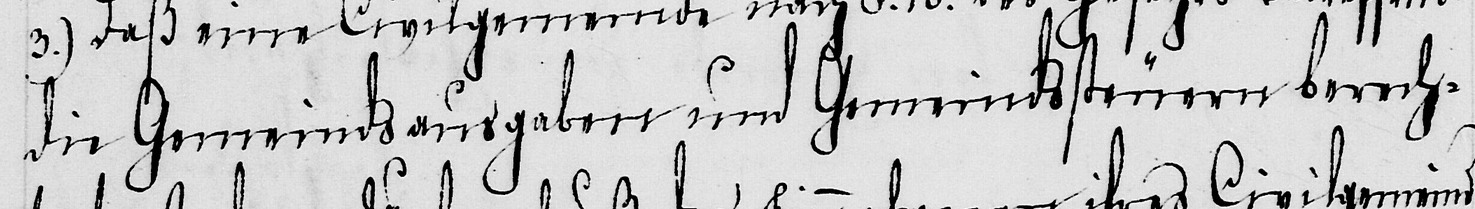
die Gemeindsausgaben und Gemeindssteuern berech¬
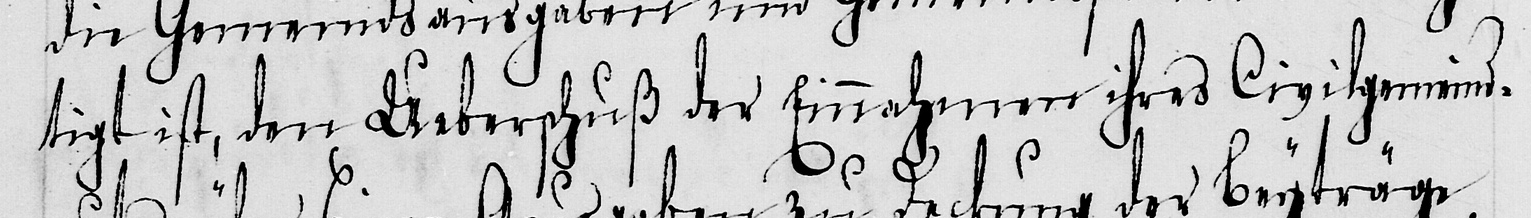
tigt ist, den Ueberschuß der Einnahmen ihres Civilgemeind¬
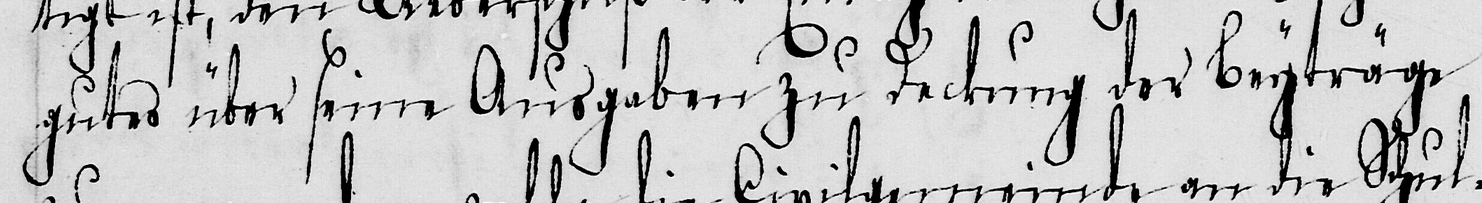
gutes über seine Ausgaben zu Deckung der Beyträge
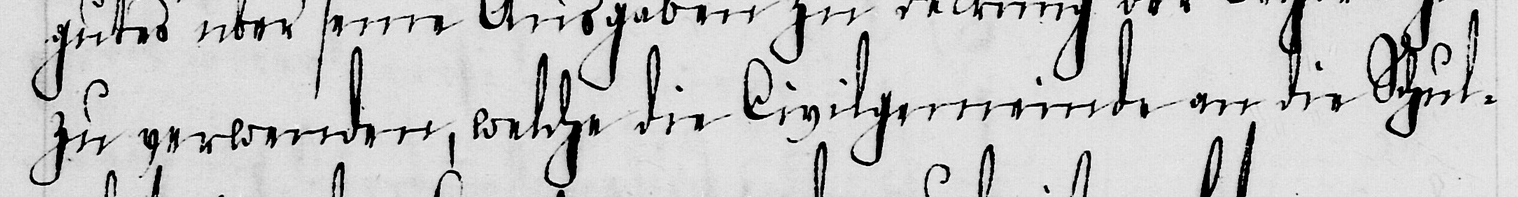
zu verwenden, welche die Civilgemeinde an die Schul¬
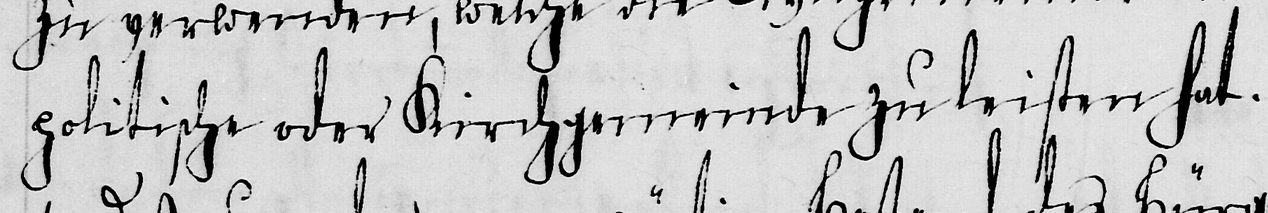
politische oder Kirchgemeinde zu leisten hat.
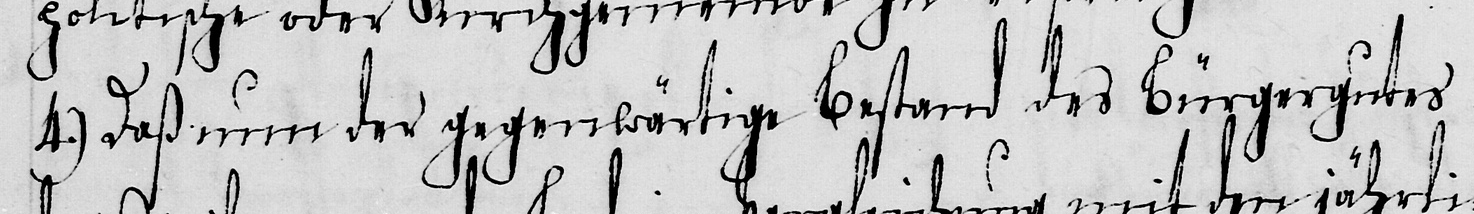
4.) Daß nun der gegenwärtige Bestand des Bürgergutes
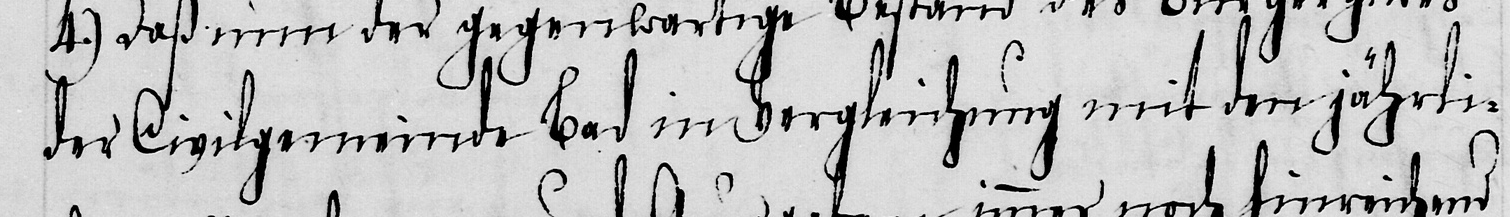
der Civilgemeinde Bad in Vergleichung mit den jährli¬
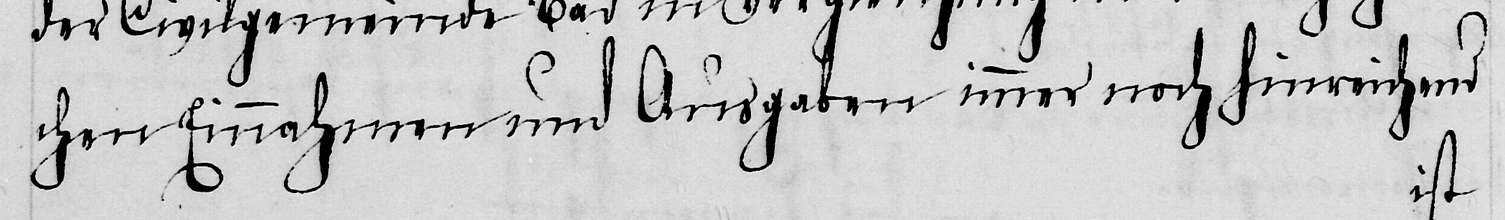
chen Einnahmen und Ausgaben immer noch hinreichend
